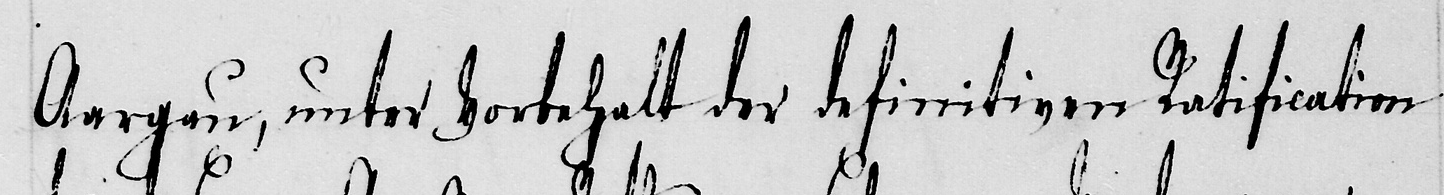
Aargau, unter Vorbehalt der definitiven Ratification
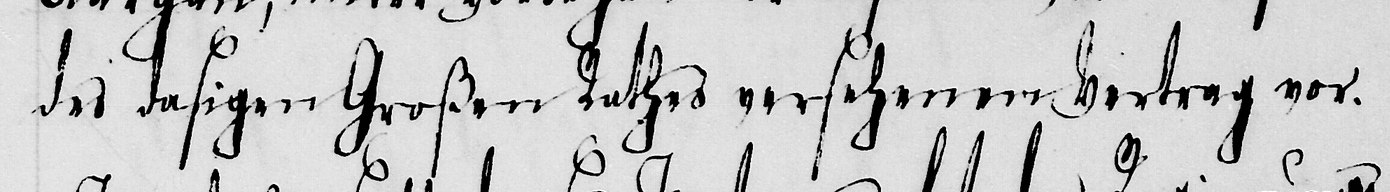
des dasigen Großen Rathes versehenen Vertrag vor.
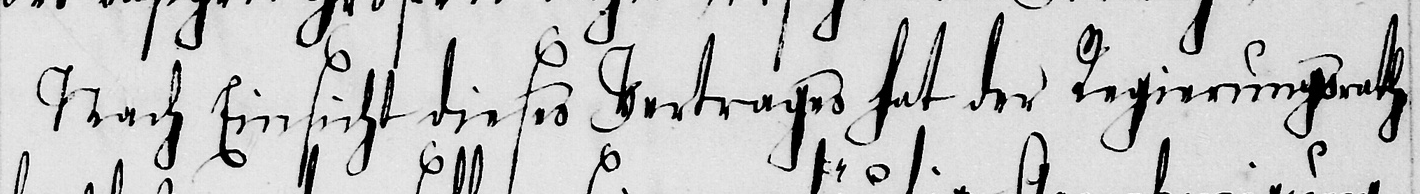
Nach Einsicht dieses Vertrages hat der Regierungsrath
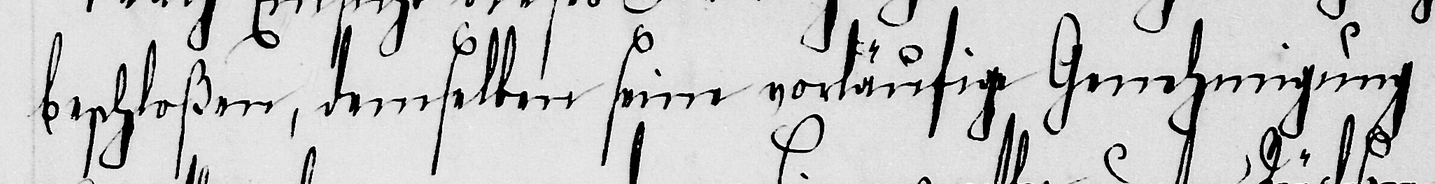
beschloßen, demselben seine vorläufige Genehmigung
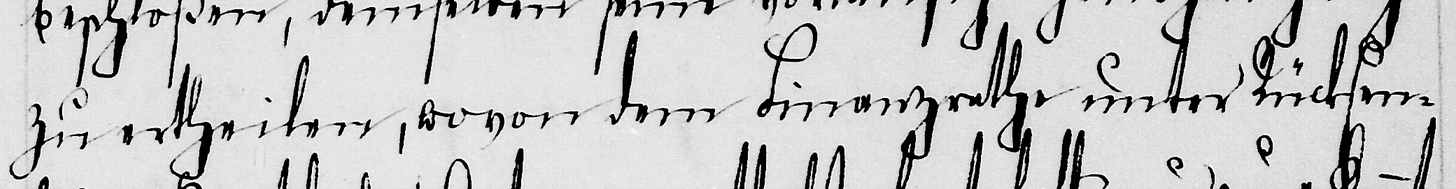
zu ertheilen, wovon dem Finanzrathe unter Rücksen¬
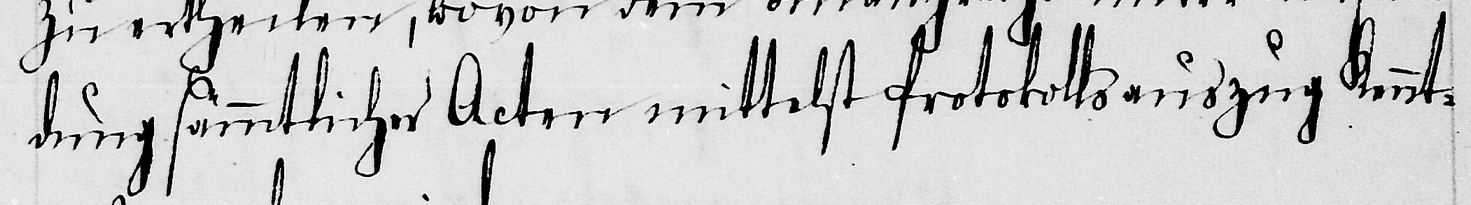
dung sämmtlicher Acten mittelst Protokollsauszug Kennt¬
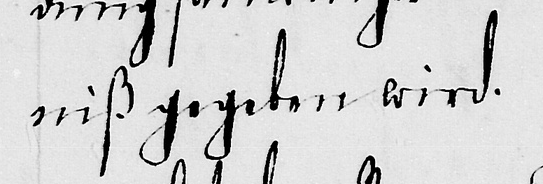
niß gegeben wird.
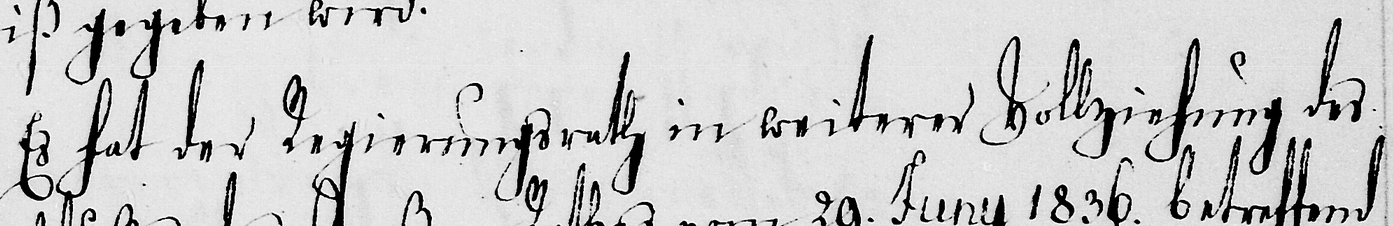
Es hat der Regierungsrath in weiterer Vollziehung des
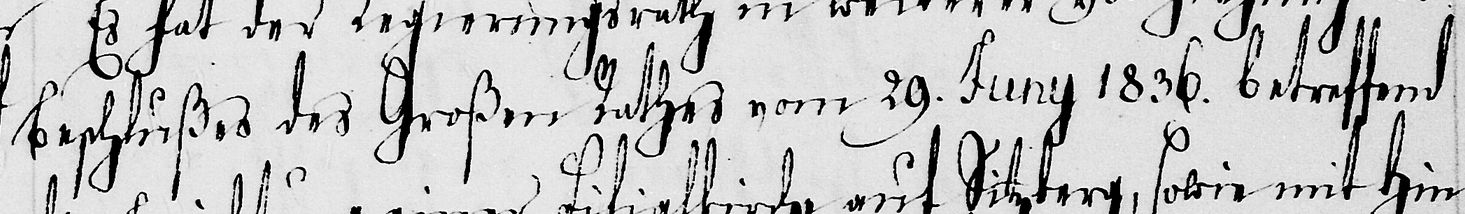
Beschlußes des Großen Rathes vom 29. Juny 1836. betreffend
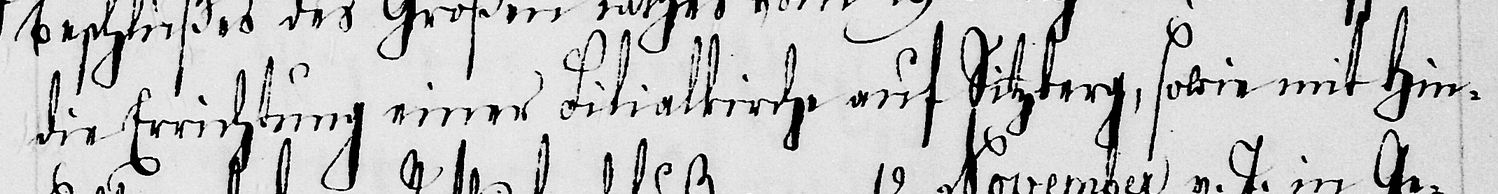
die Errichtung einer Filialkirche auf Sitzberg, sowie mit Hin¬
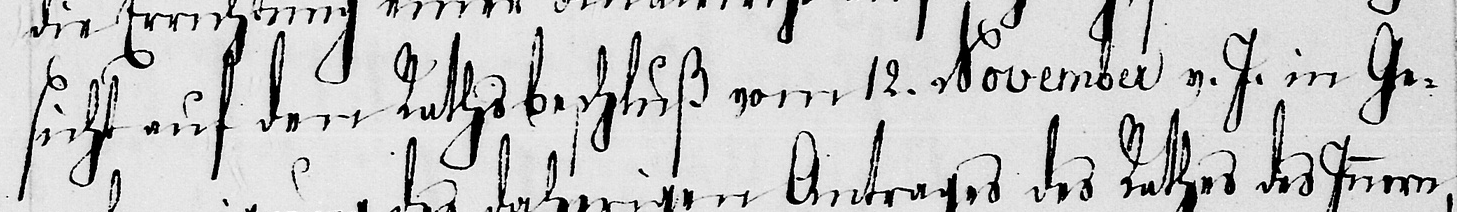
sicht auf den Rathsbeschluß vom 12. November v. J. in Ge¬
